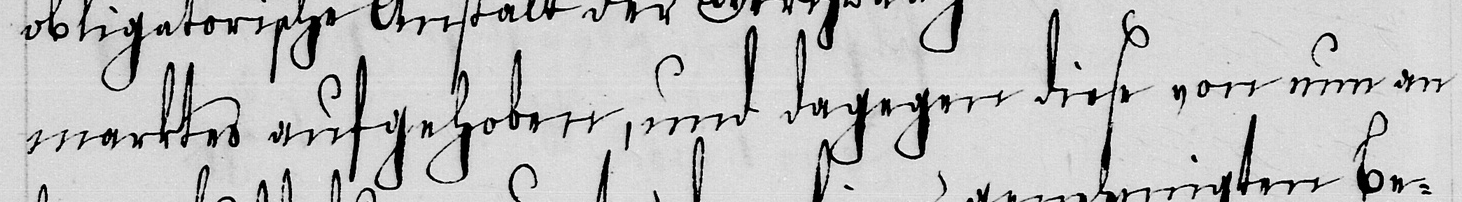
marktes aufgehoben, und dagegen diese von nun an
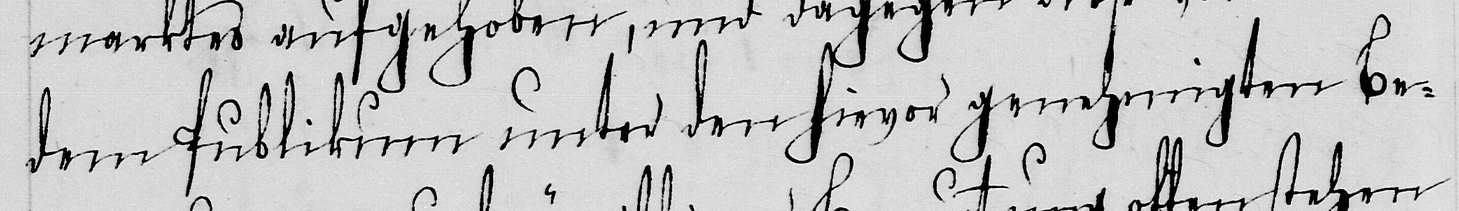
dem Publikum unter den hievor genehmigten Be¬
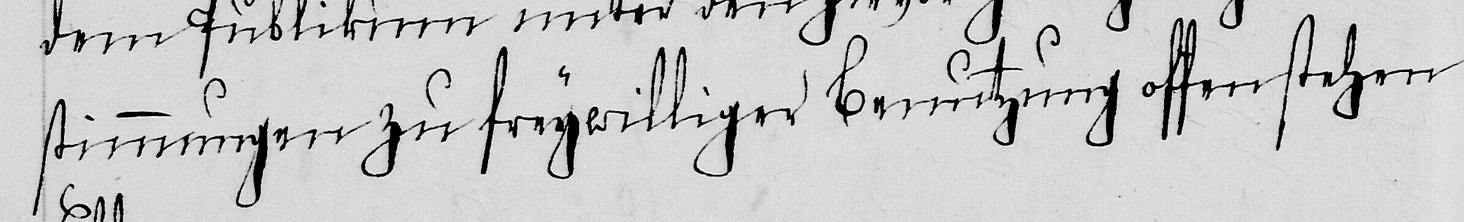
stimmungen zu freywilliger Benutzung offen stehen
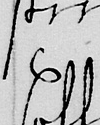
solle.
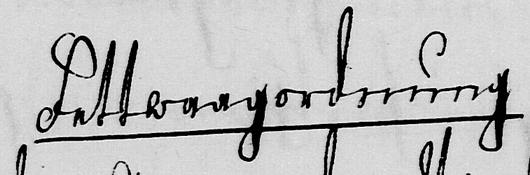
Fettwaagordnung
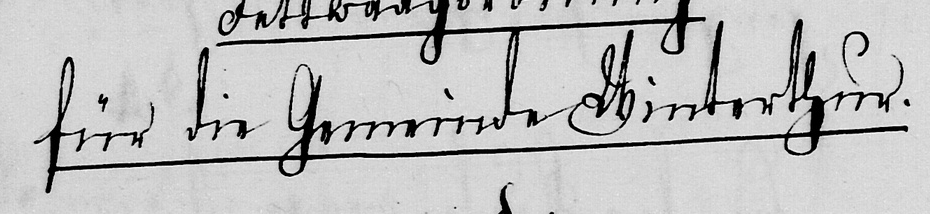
für die Gemeinde Winterthur.
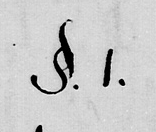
§. 1.
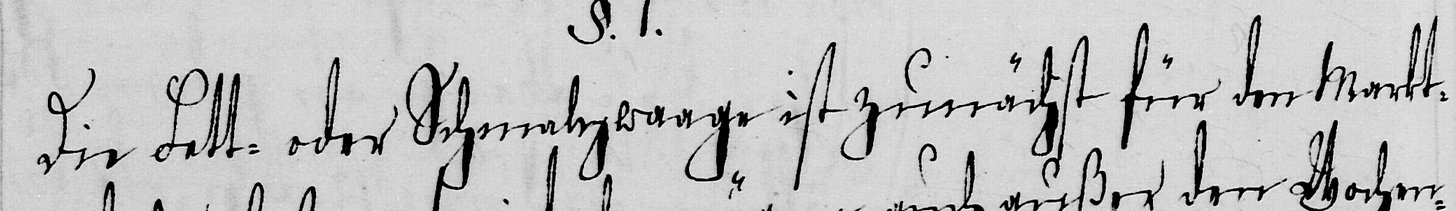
Die Fett- oder Schmalzwaage ist zunächst für den Markt¬
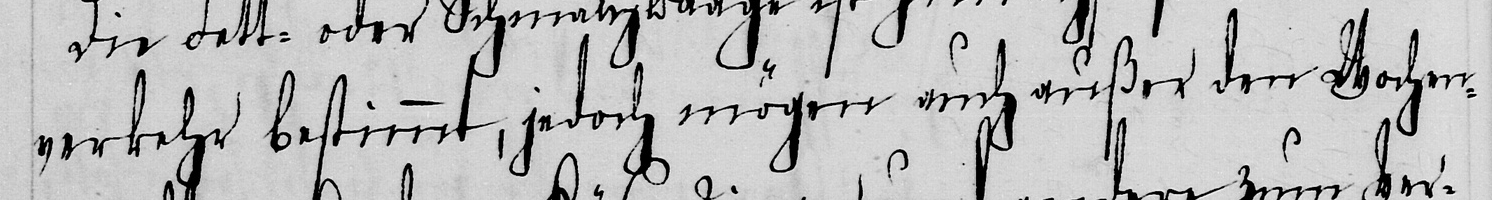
verkehr bestimmt, jedoch mögen auch außer den Wochen¬
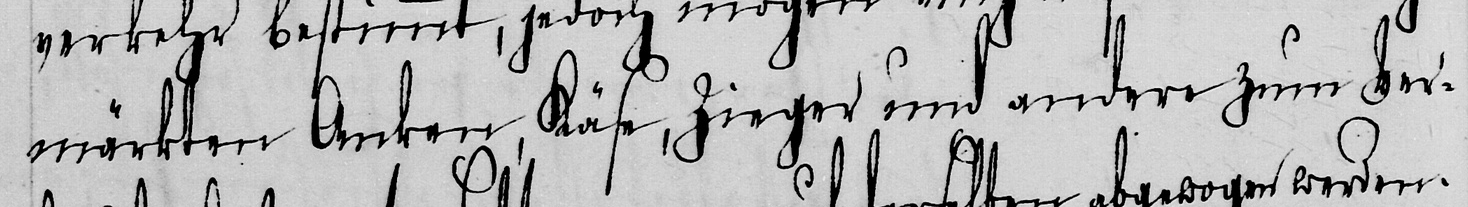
märkten Anken, Käse, Zieger und andere zum Ver¬
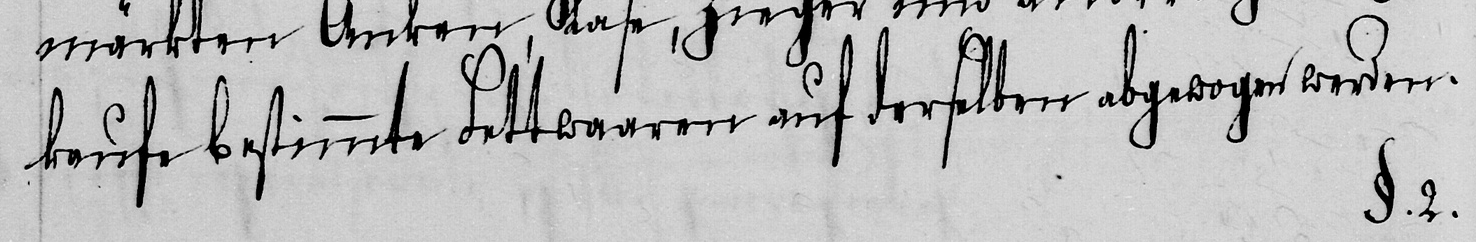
kaufe bestimmte Fettwaaren auf derselben abgewogen werden.
